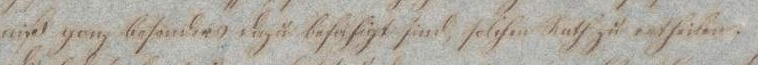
niß ganz besonders dazu befähigt sind, solchen Rath zu ertheilen.
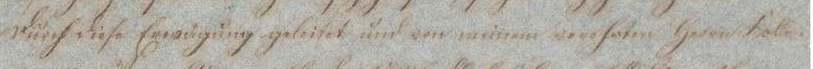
Durch diese Erwägung geleitet und von meinem verehrten Herrn Kolle-
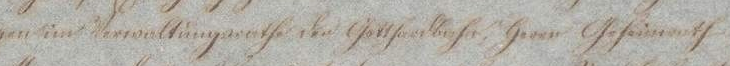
gen im Verwaltungsrathe der Gotthardbahn, Herrn Geheimrath
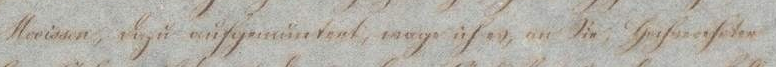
Mevissen, dazu aufgemuntert, wage ich es, an Sie, Hochverehrter
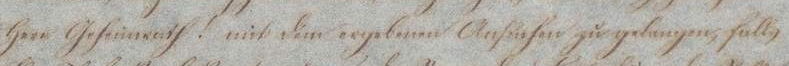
Herr Geheimrath! mit dem ergebenen Ansuchen zu gelangen, falls
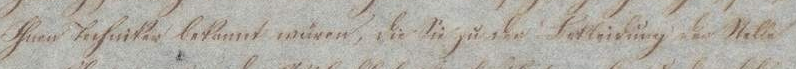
Ihnen Techniker bekannt wären, die Sie zu der Bekleidung der Stelle
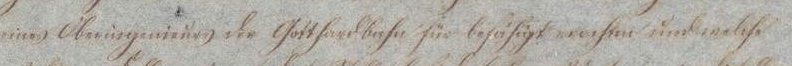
eines Oberingenieurs der Gotthardbahn für befähigt erachten und welche
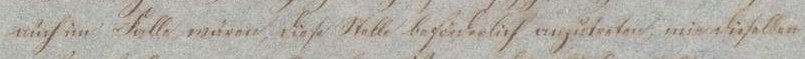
auch im Falle wären, diese Stelle beförderlich anzutreten, mir dieselben
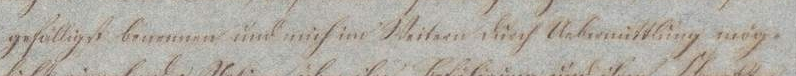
gefälligst benennen und mich im Weitern durch Uebermittlung mög-
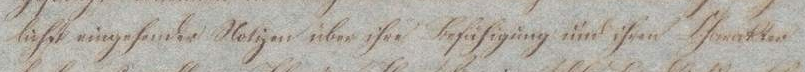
lichst eingehender Notizen über ihre Befähigung und ihren Charakter
